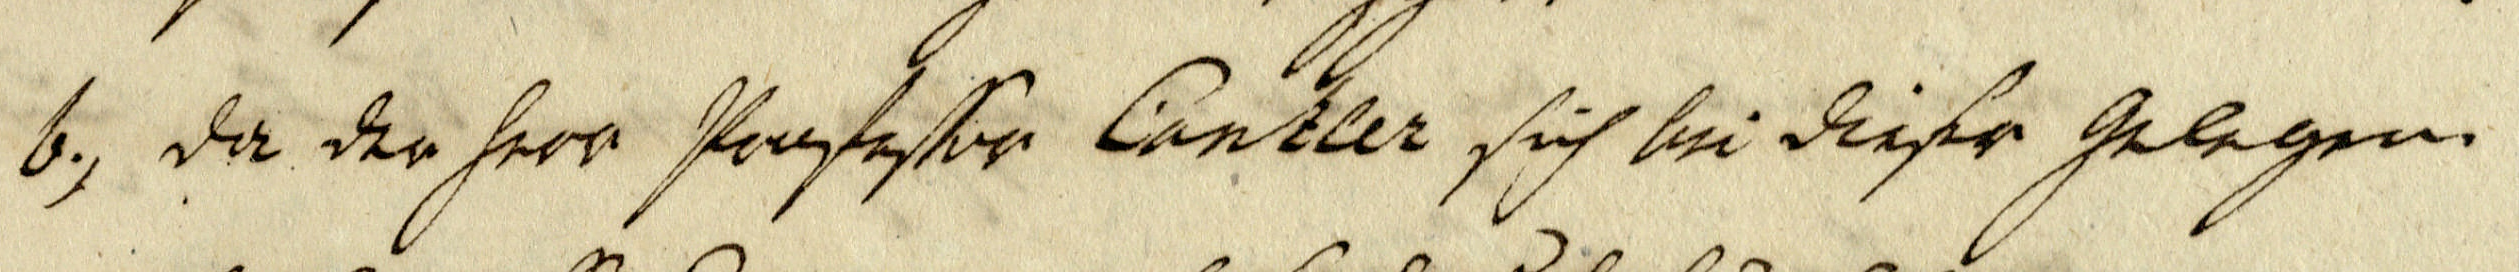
b, da der Herr Professor Canzler sich bei dieser Gelegen¬
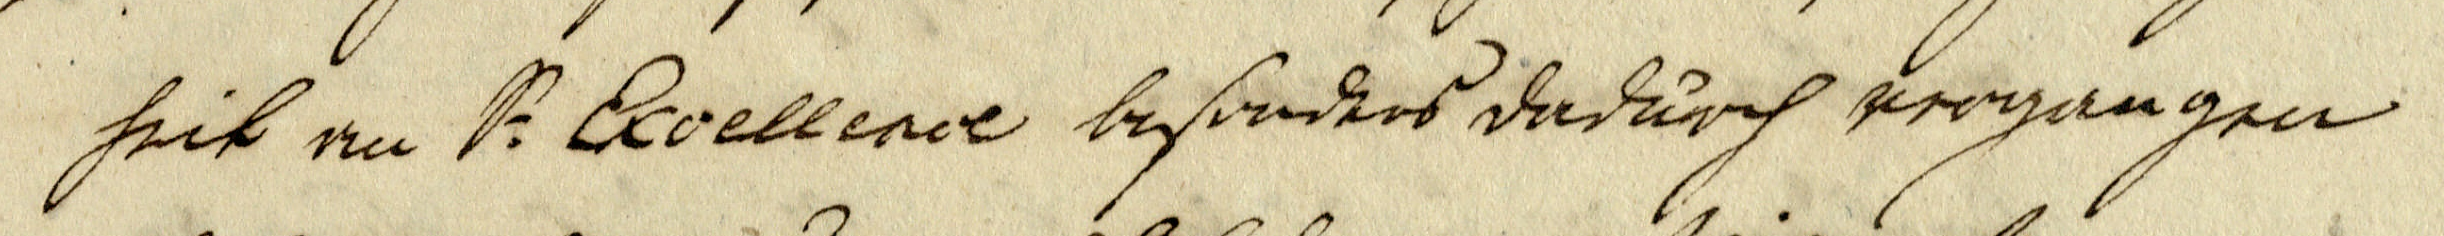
heit an Sr Excellence besonders dadurch vergangen
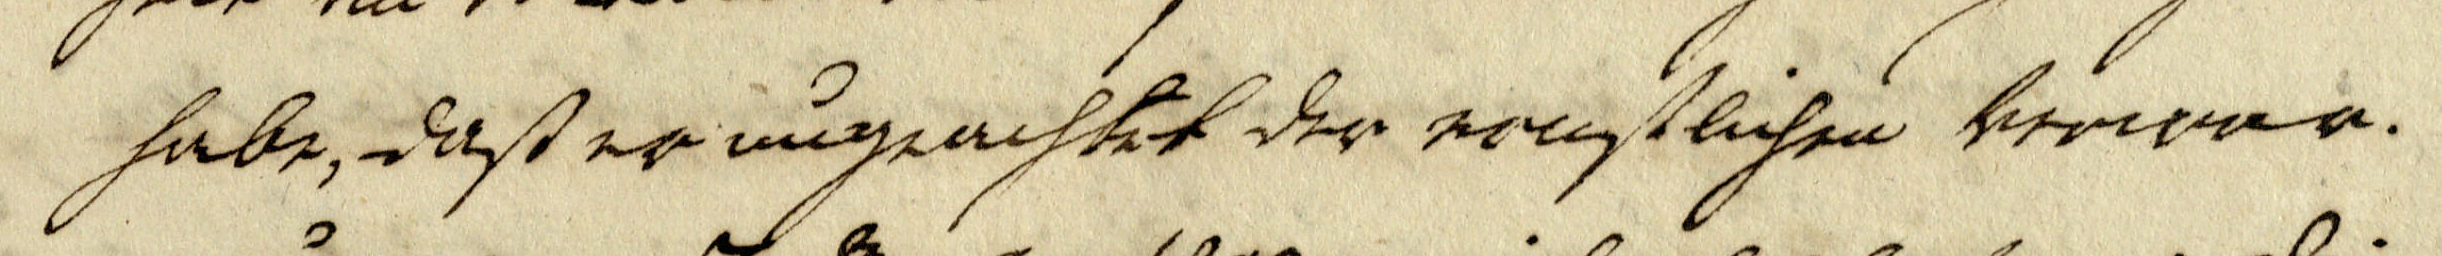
habe, daß er ungeachtet der ernstlichen Verwar¬
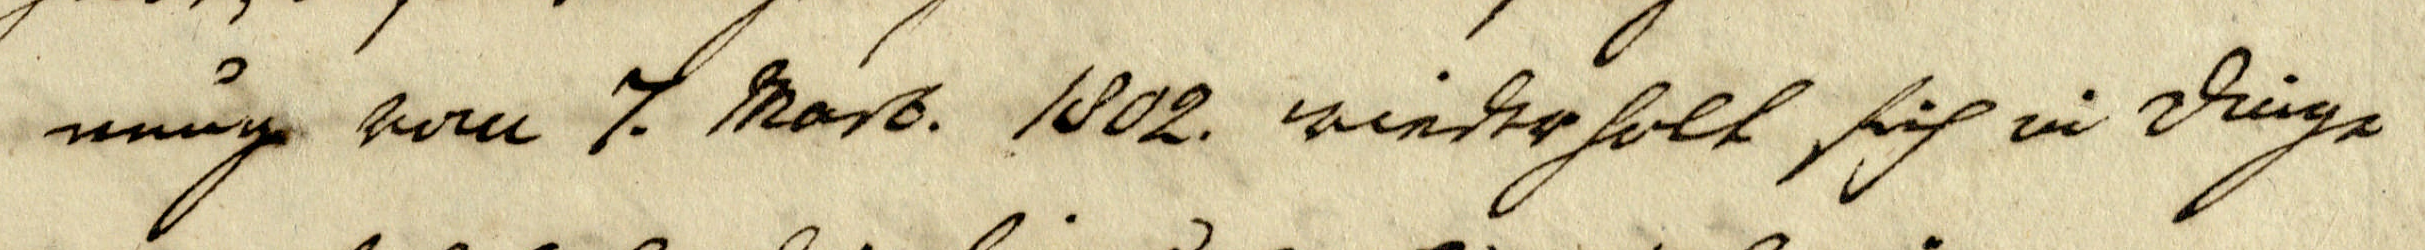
nung vom 7. Mart. 1802. wiederholt sich in Dinge
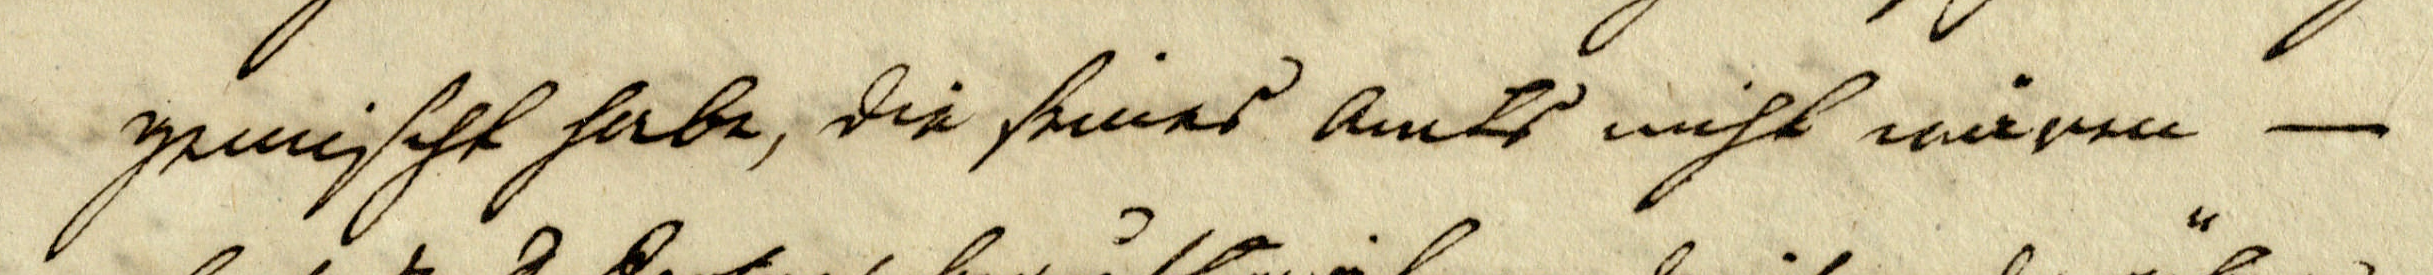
gemischt habe, die seines Amts nicht wären
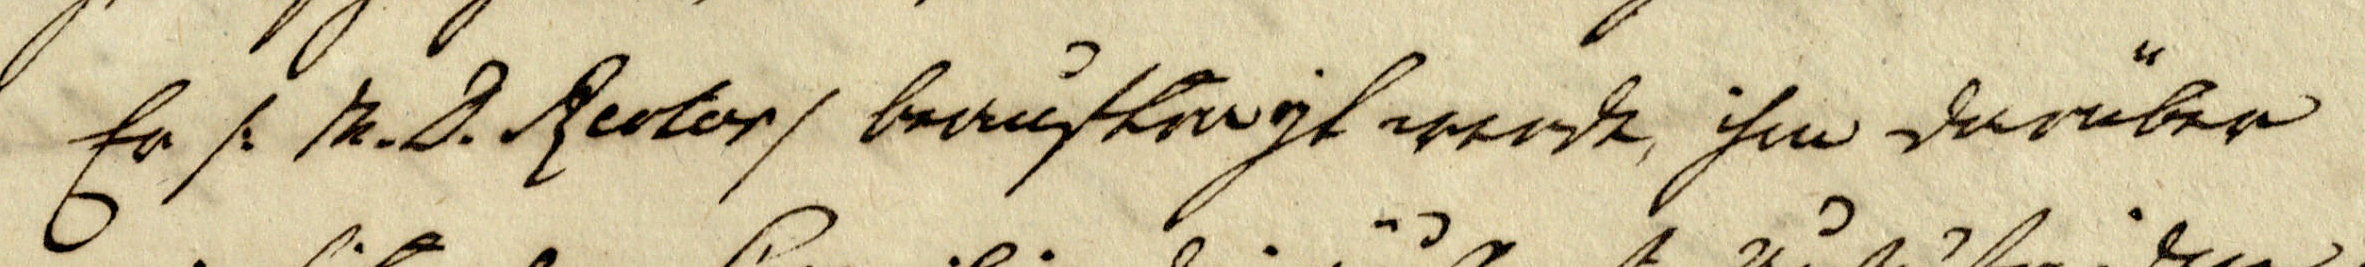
Er /: M. D. Rector/ beauftragt werde, ihm darüber
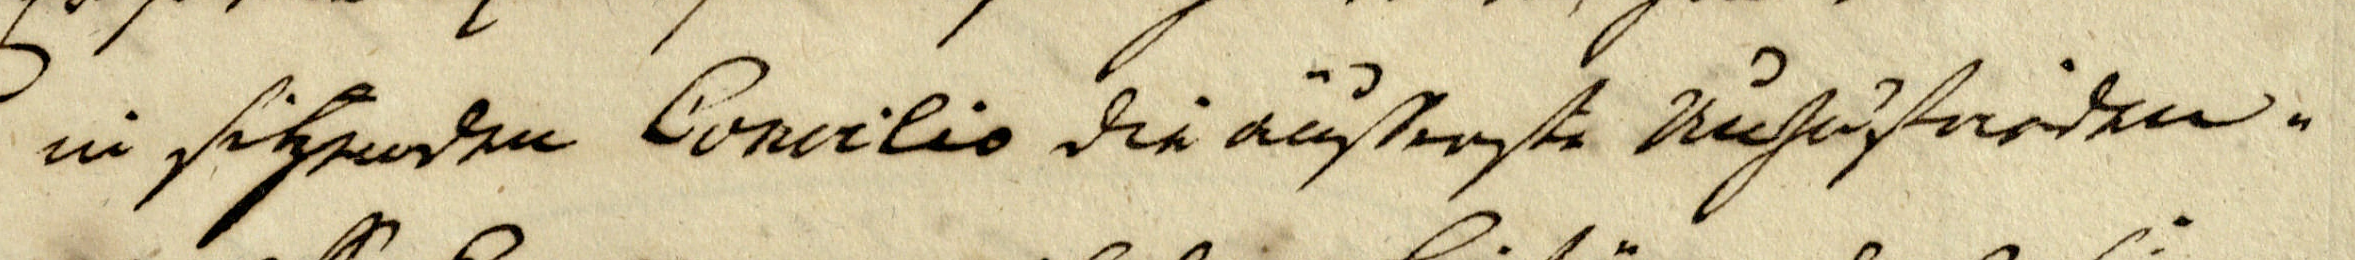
in sitzenden Concilio die äusserste Unzufrieden¬
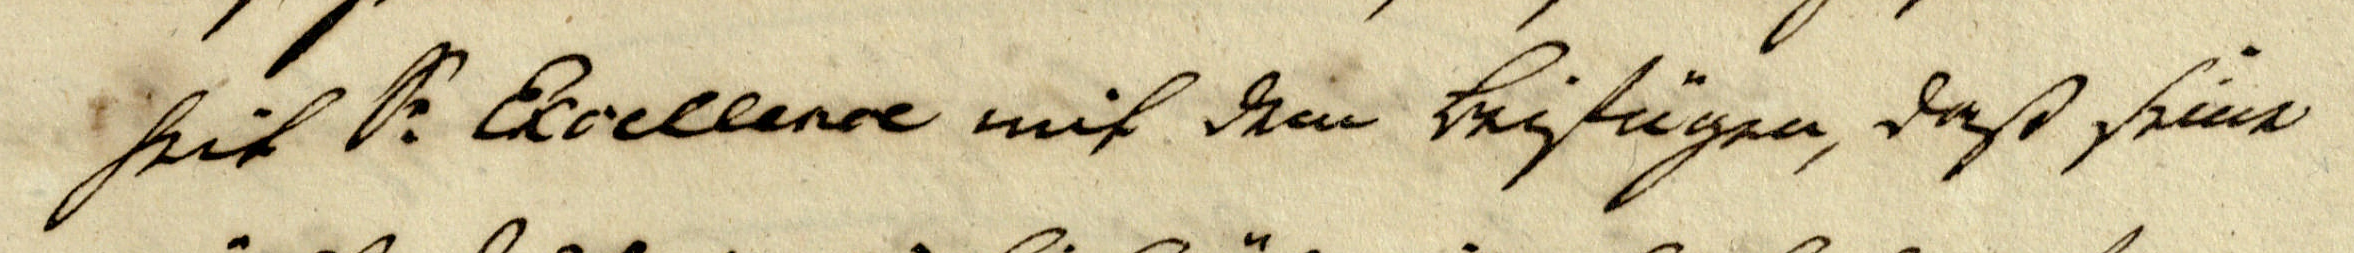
heit Sr. Excellence mit dem Beifügen, daß seine
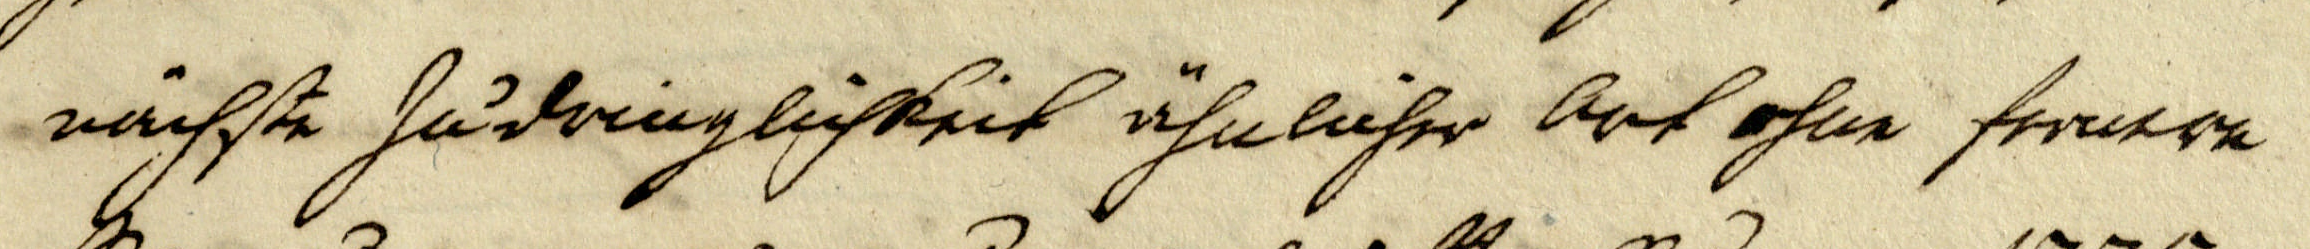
nächste Zudringlichkeit ähnlicher Art ohne fernere
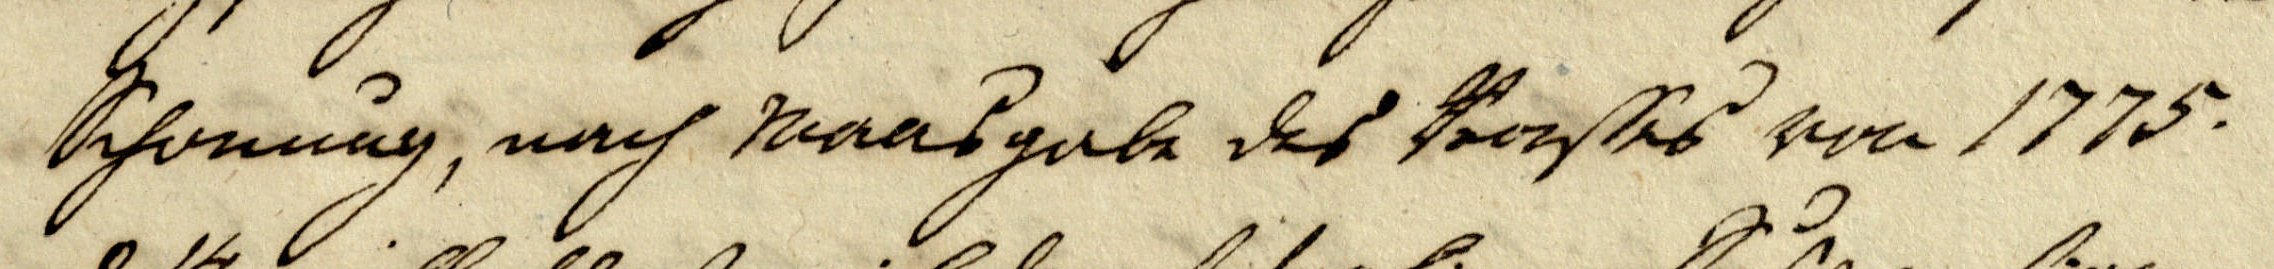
Schonung, nach Maasgabe des Recesses von 1775.
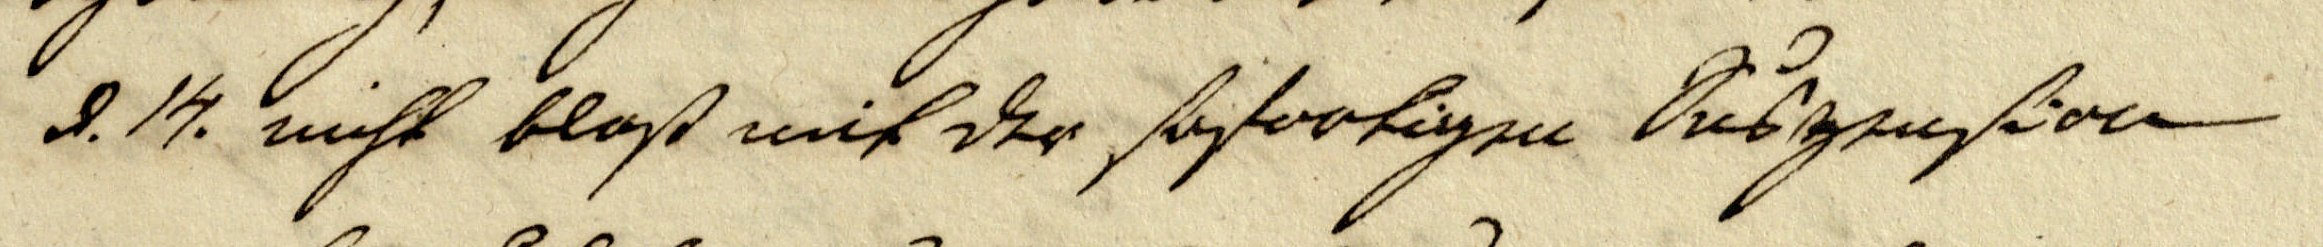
§. 14. nicht bloß mit der sofortigen Suspension
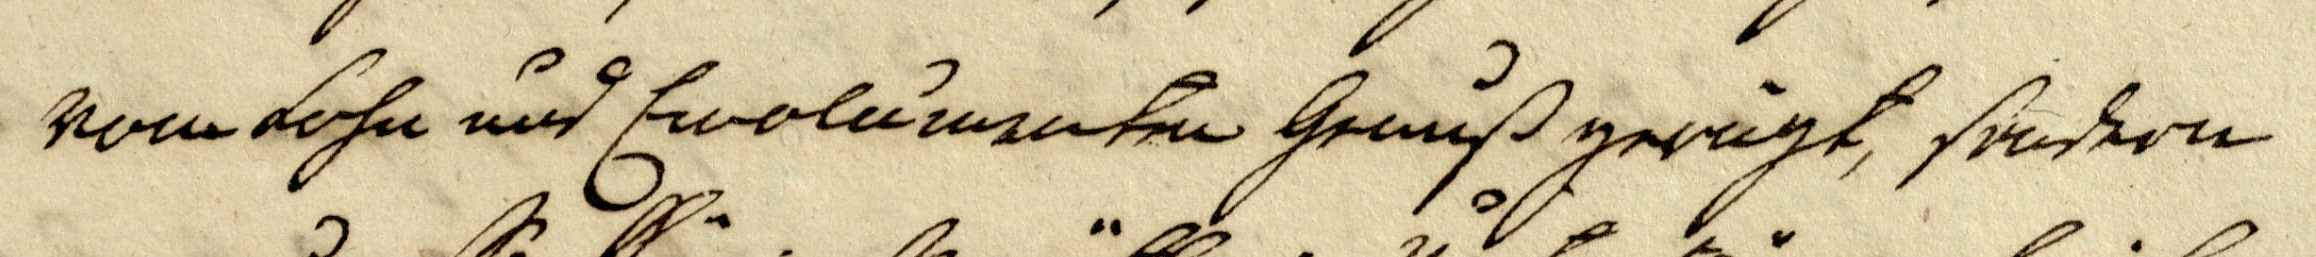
vom Lohn und Emolumenten Genuß gerügt, sondern
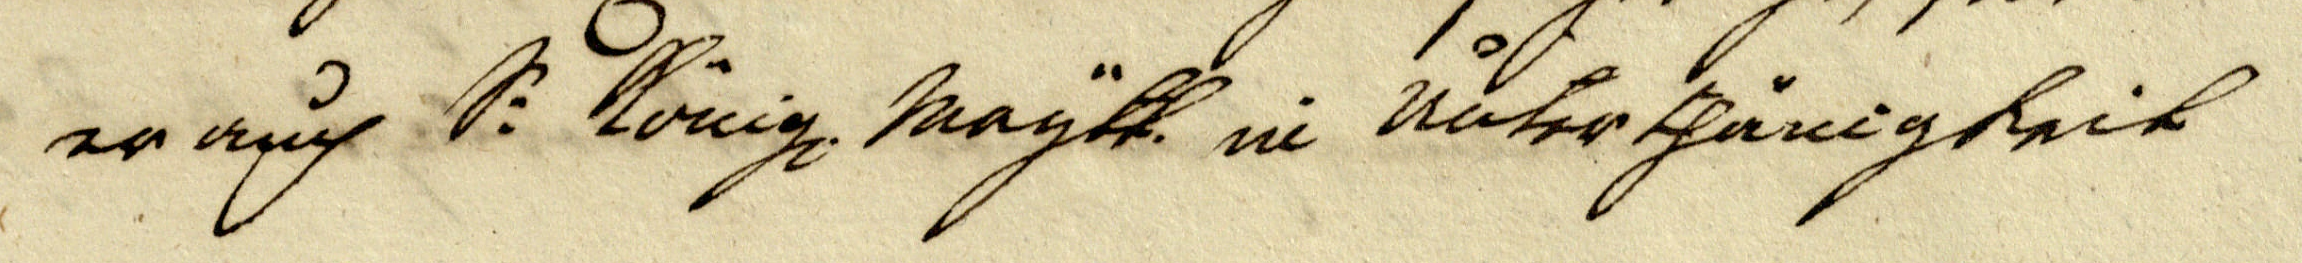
er auch Sr. Königl. Maÿtt. in Unterthänigkeit
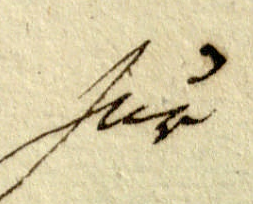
zur
